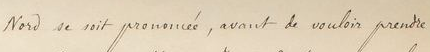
Nord se soit prononcée, avant de vouloir prendre
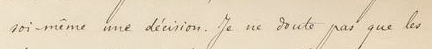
soi-même une décision. Je ne doute pas que les
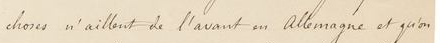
choses n'aillent de l'avant en Allemagne et qu'on
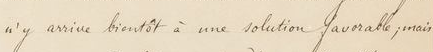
n'y arrive bientôt à une solution favorable; mais
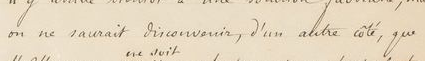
on ne saurait disconvenir, d'un autre côté, que
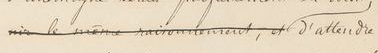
nir le même raisonnement, et d'attendre
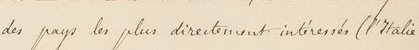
des pays les plus directement intéressés (l'Italie
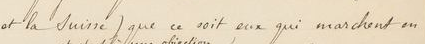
et la Suisse) que ce soit eux qui marchent en
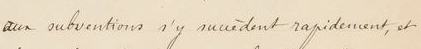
aux subventions s'y succèdent rapidement, et
